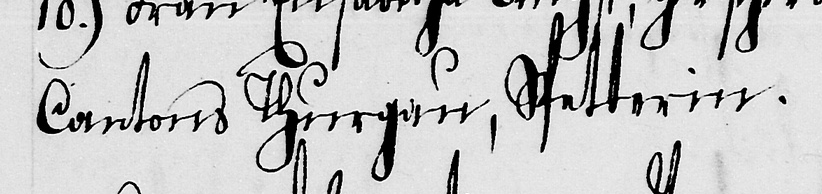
Cantons Thurgau, Spetterin.
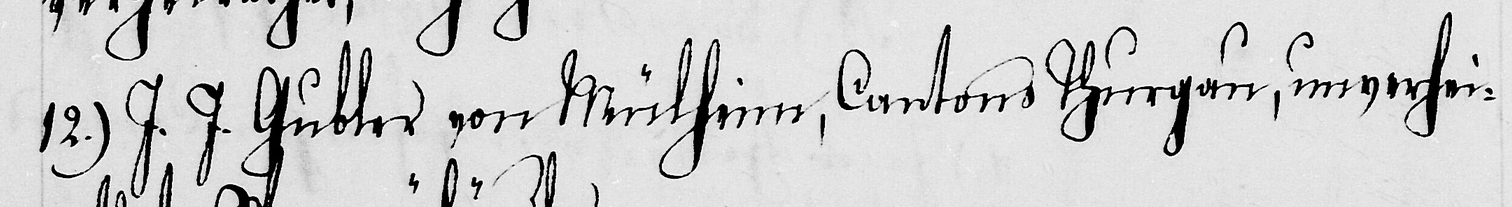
12.) J. J. Gubler von Mülheim, Cantons Thurgau, unverhei¬
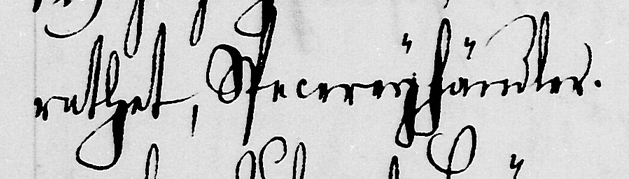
rathet, Specereyhändler.
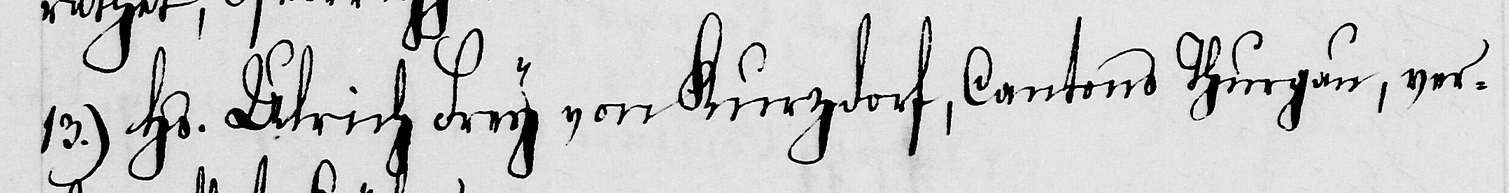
13.) Hs. Ulrich Frey von Kurzdorf, Cantons Thurgau, ver¬
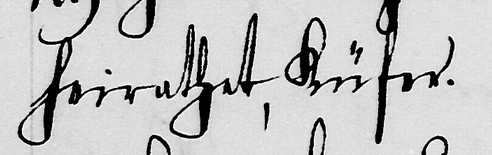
heirathet, Küfer.
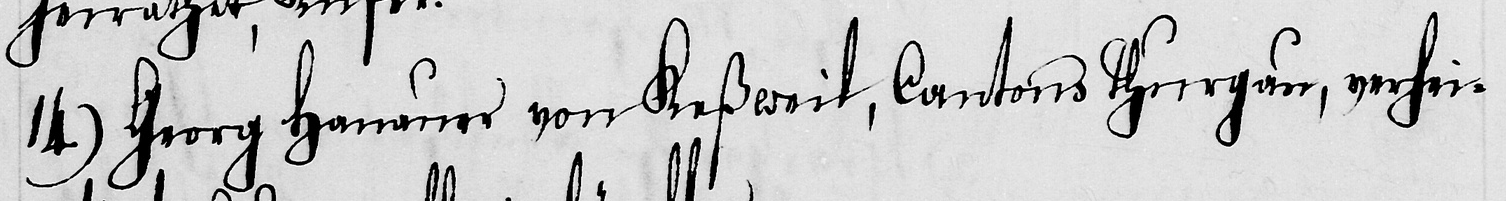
14.) Georg Hanauer von Keßweil, Cantons Thurgau, verhei¬
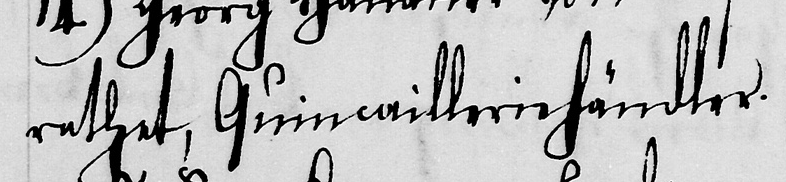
rathet, Quincailleriehändler.
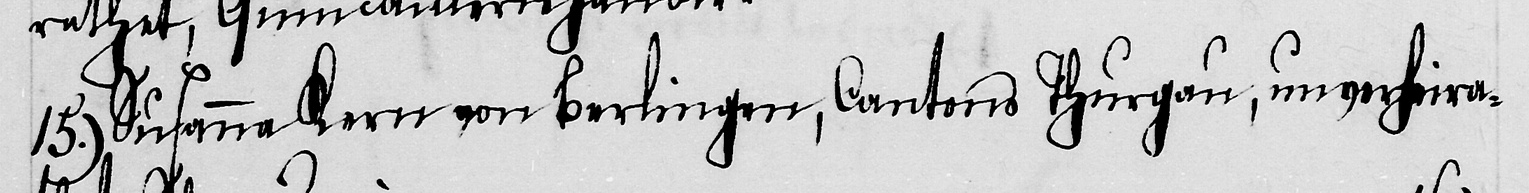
15.) Susanna Kern von Berlingen, Cantons Thurgau, unverheira¬
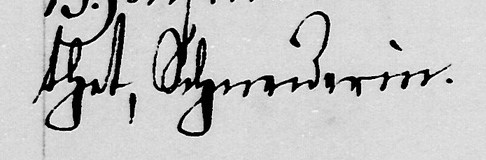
thet, Schneiderin.
